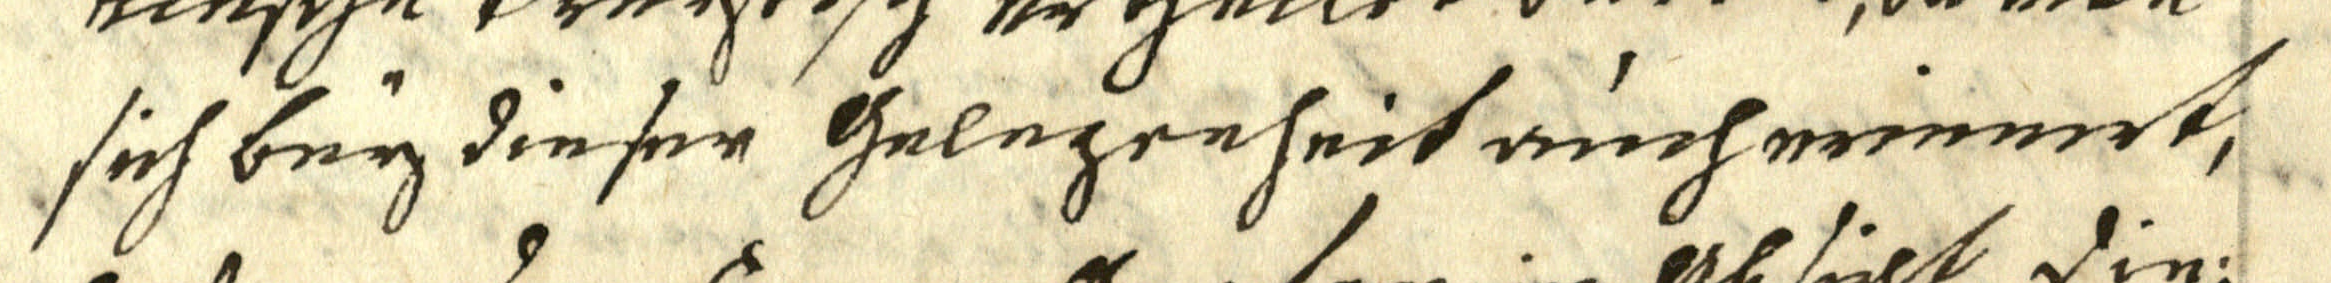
sich beÿ dieser Gelegenheit auch erinnert,
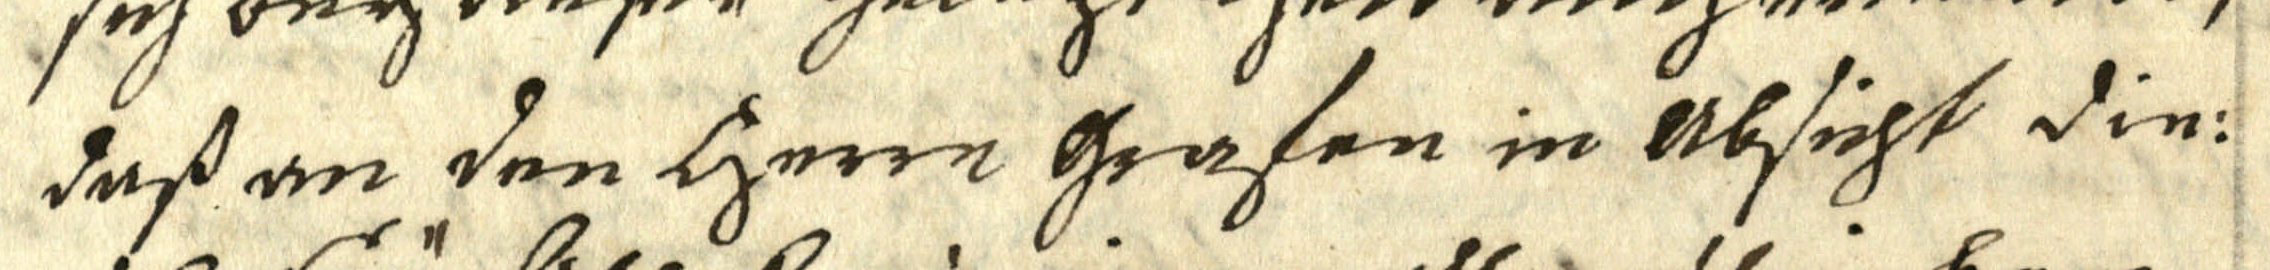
daß an den Herrn Grafen in Absicht die¬
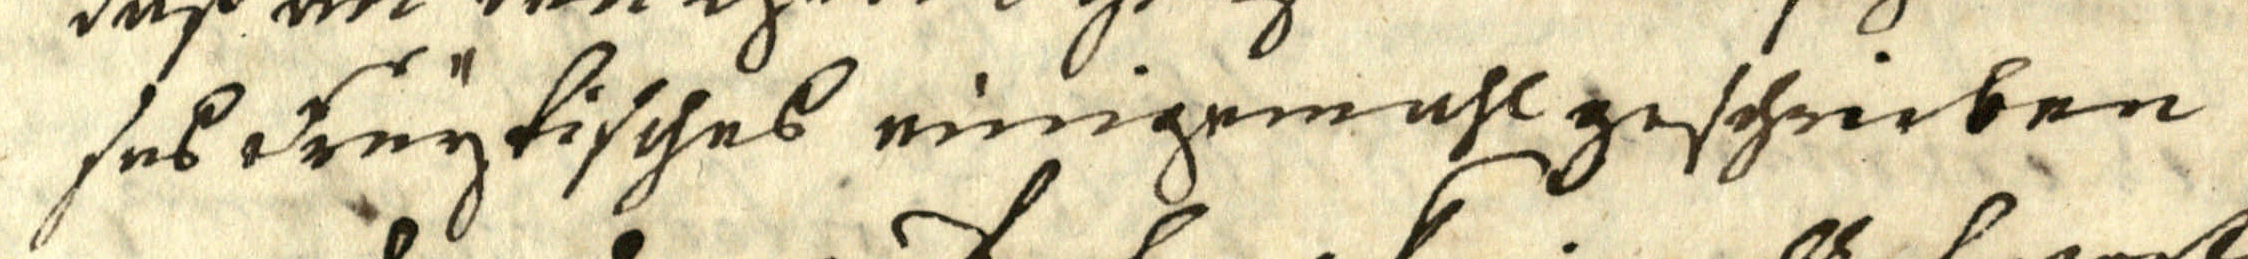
des Freÿtisches einigemahl geschrieben
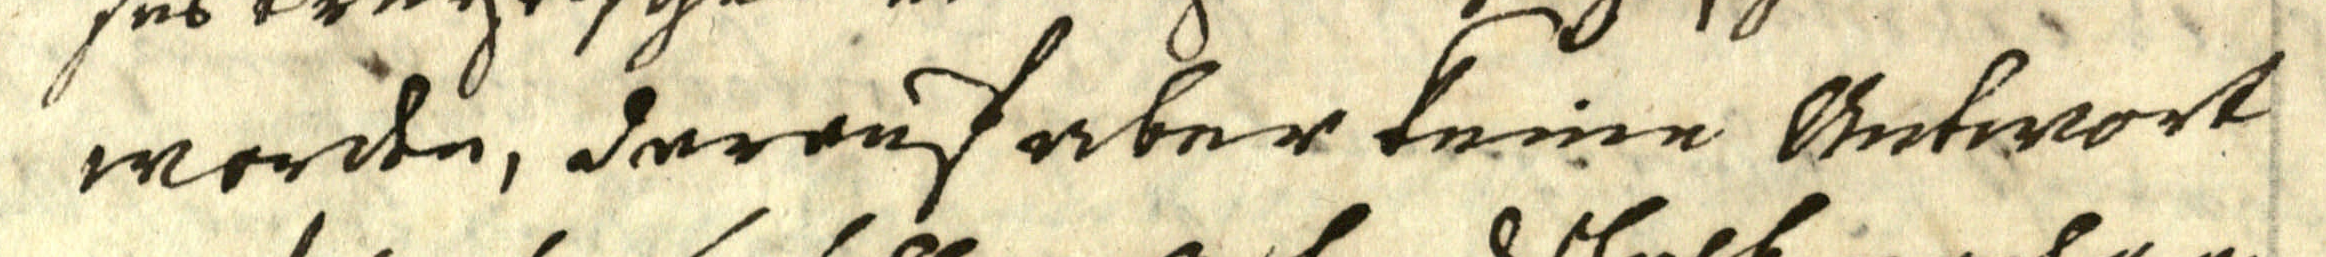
worden, darauf aber keine Antwort
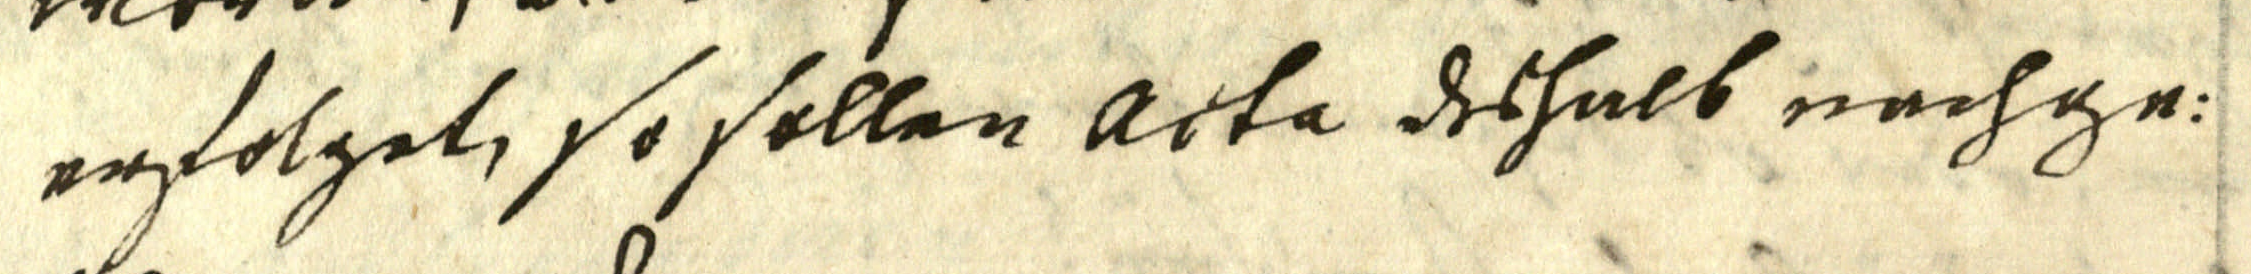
erfolget, so sollen Acta deshalb nachge¬
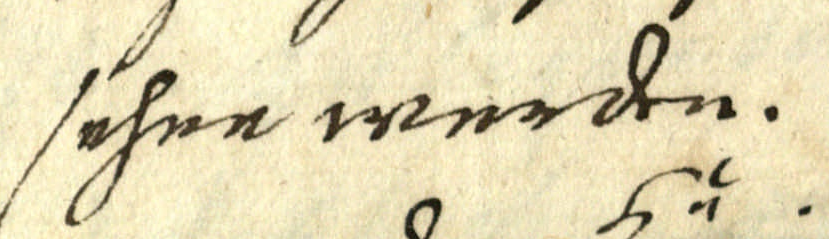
sehen werden.
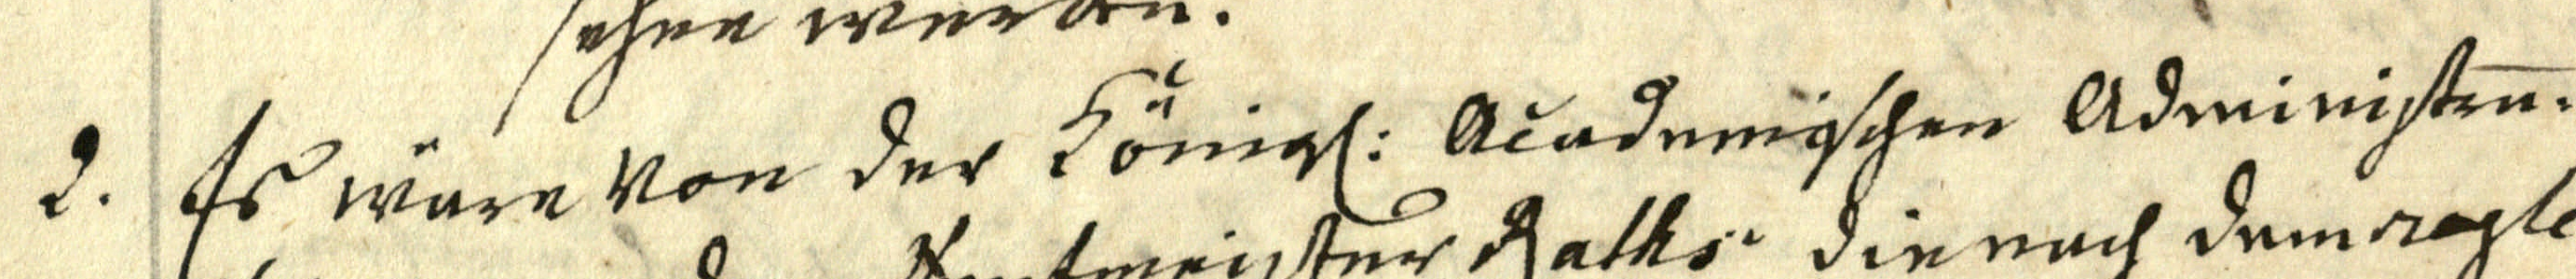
2. Es wäre von der Königl. Academischen Administra¬
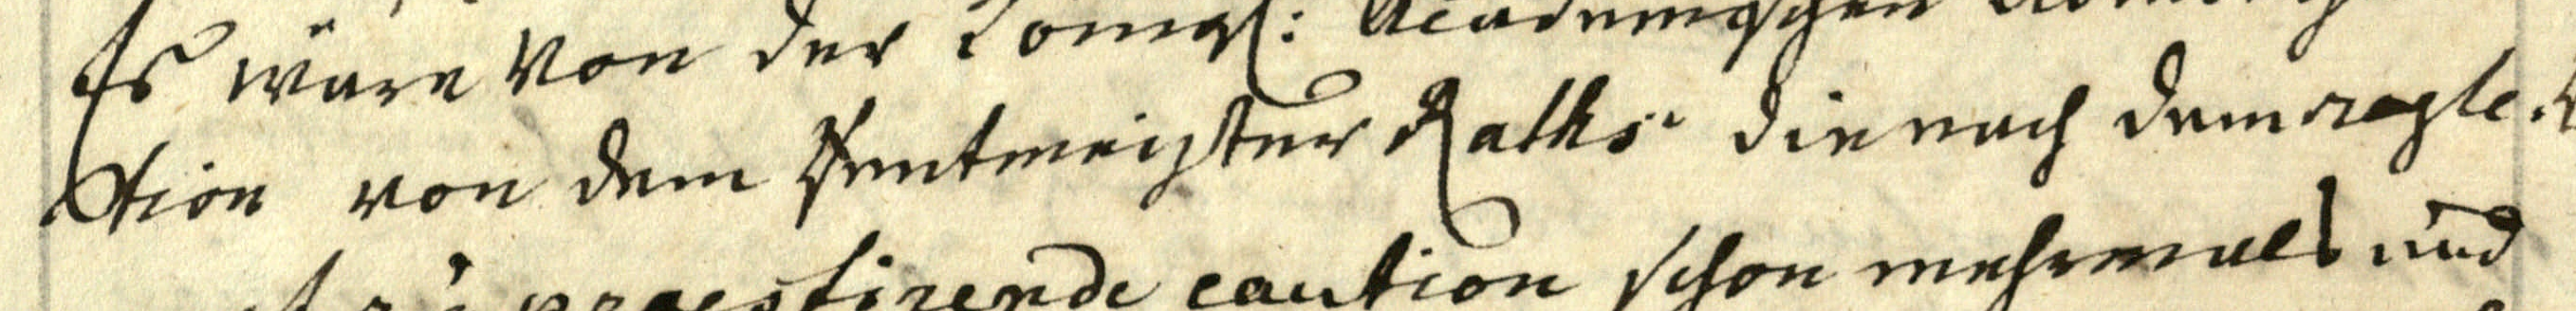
tion von dem Rentmeister Raths die nach dem regle¬
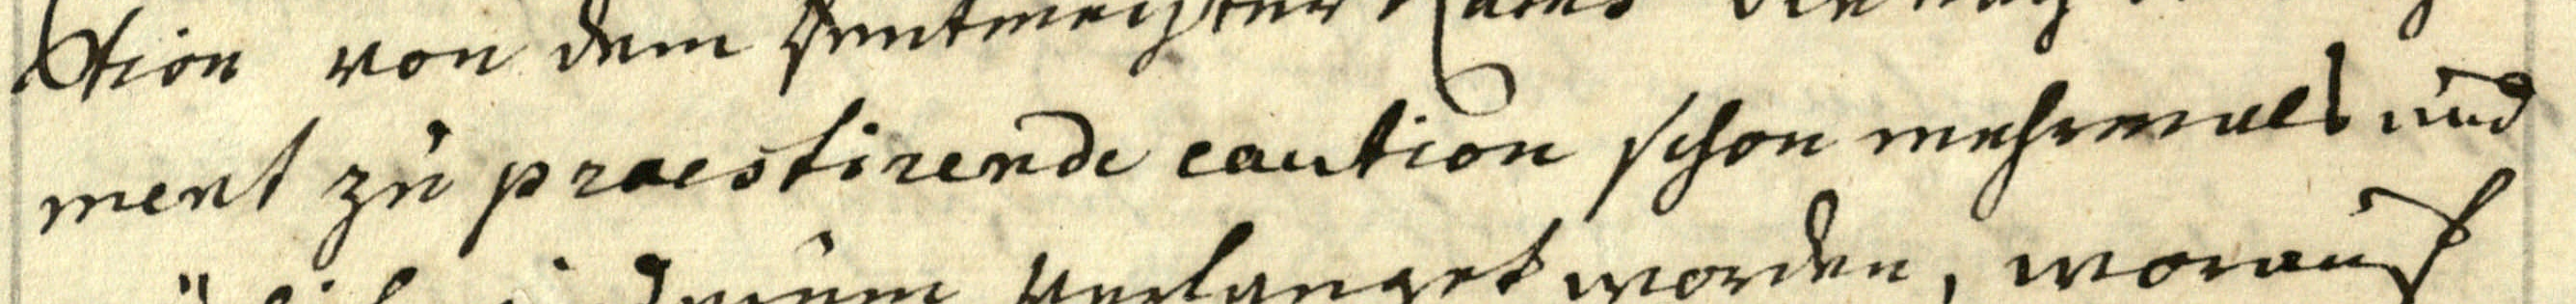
ment zu praestirende caution schon mehrmals und
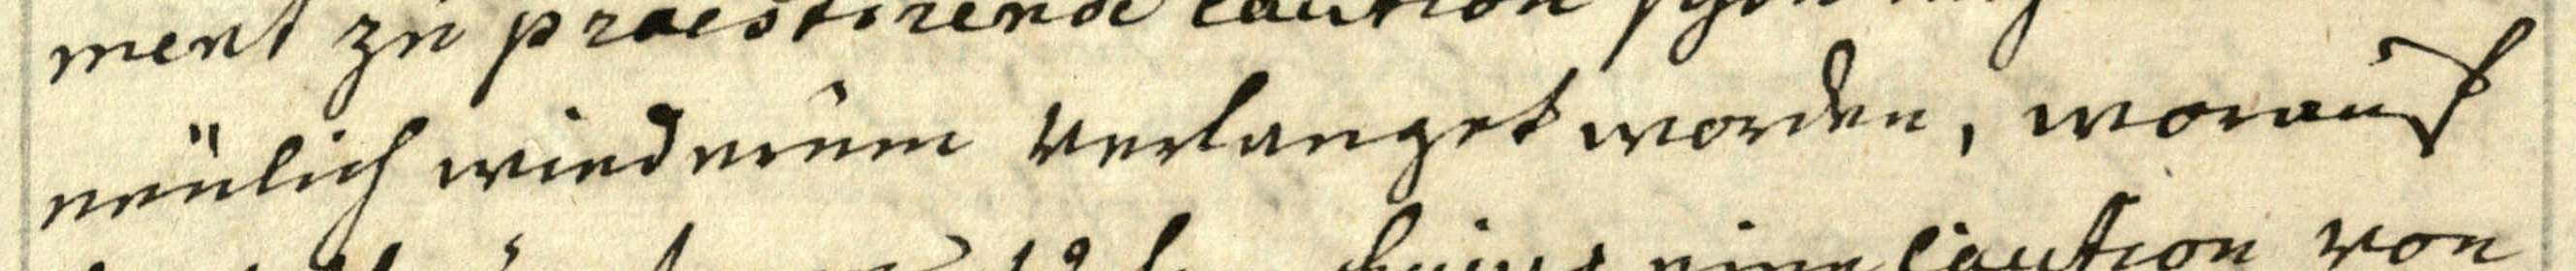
neulich wiederum verlanget worden, worauf
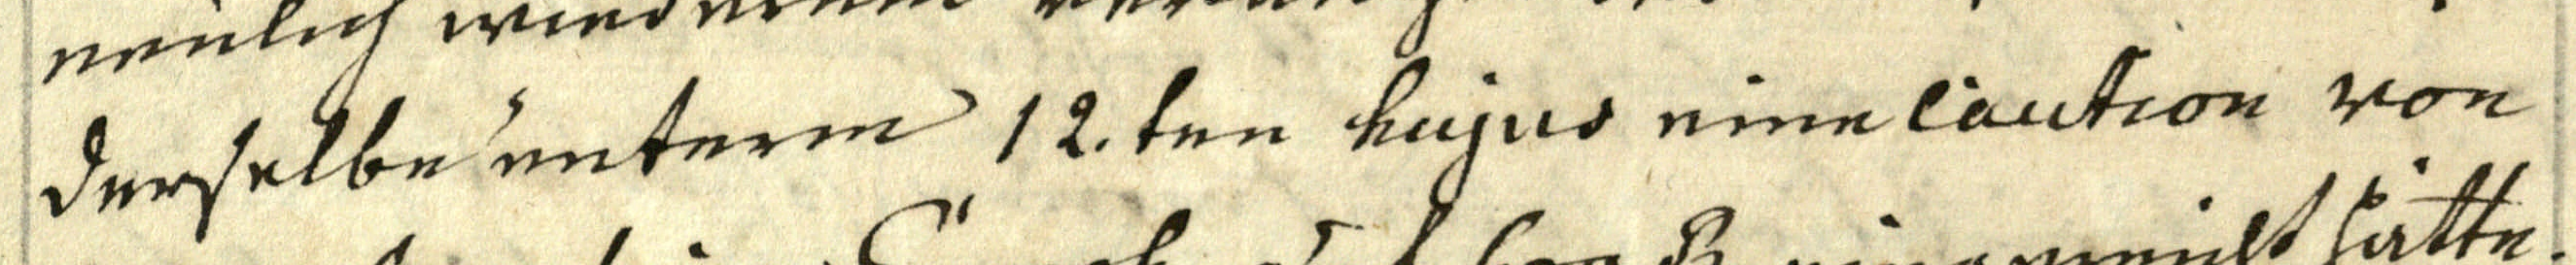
derselbe unterm 12. ten hujus eine Caution von
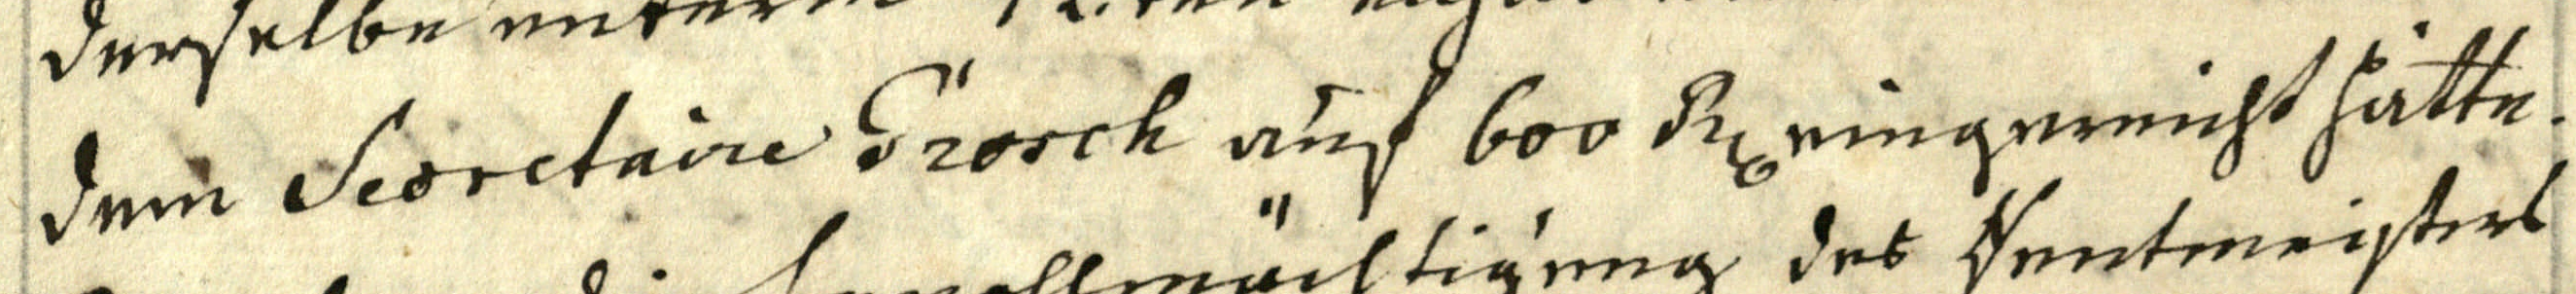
dem Secretaire Grosch auf 600 R. eingereicht hätte.
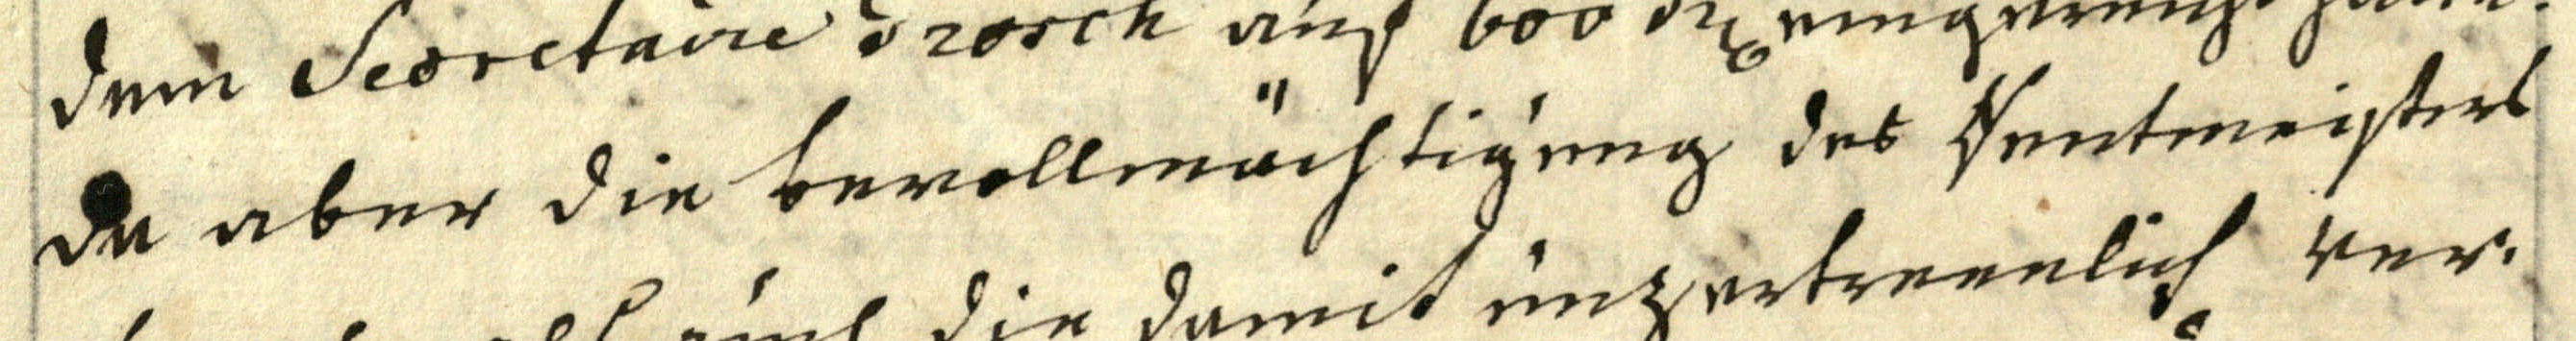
Da aber die Bevollmächtigung des Rentmeisters
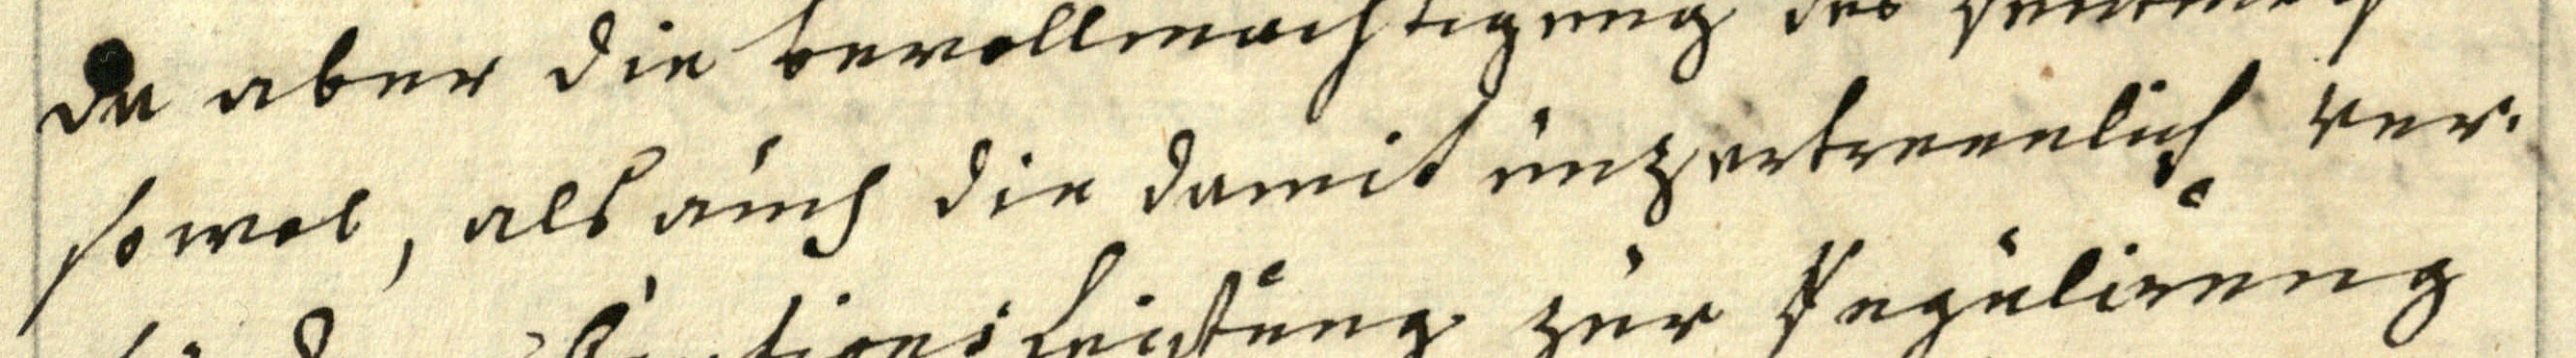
so wol, als auch die damit unzertrennlich ver¬
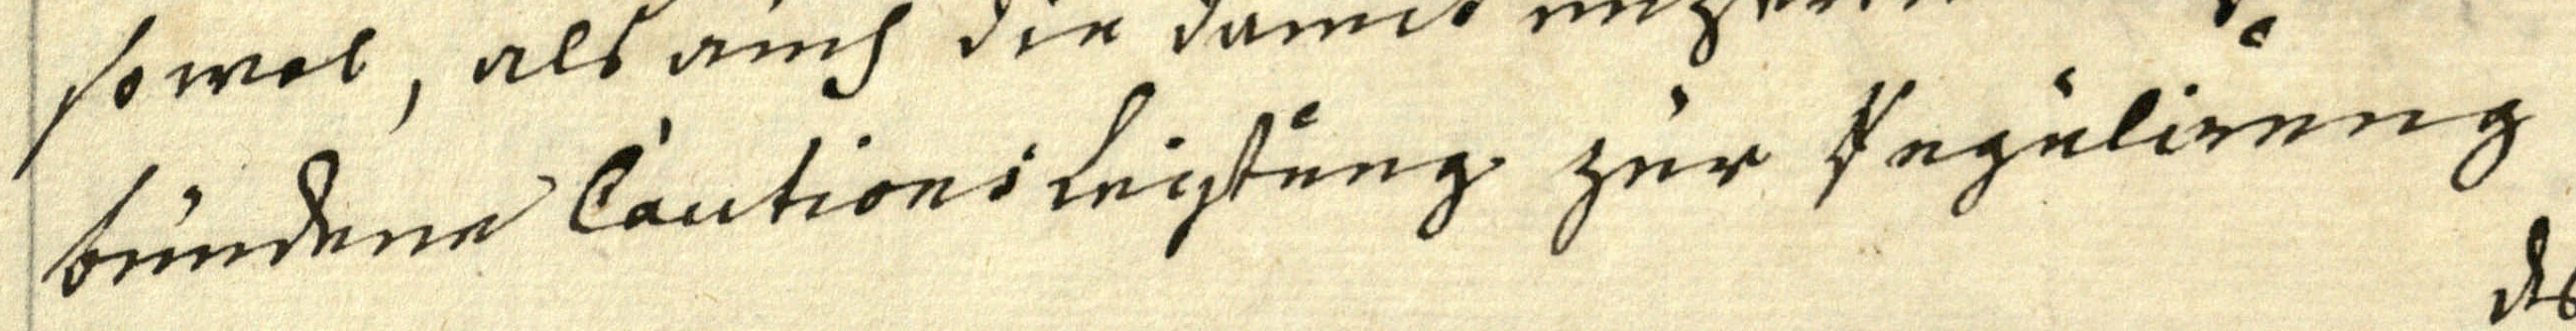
bundene Cautions leistung zur Regulirung
